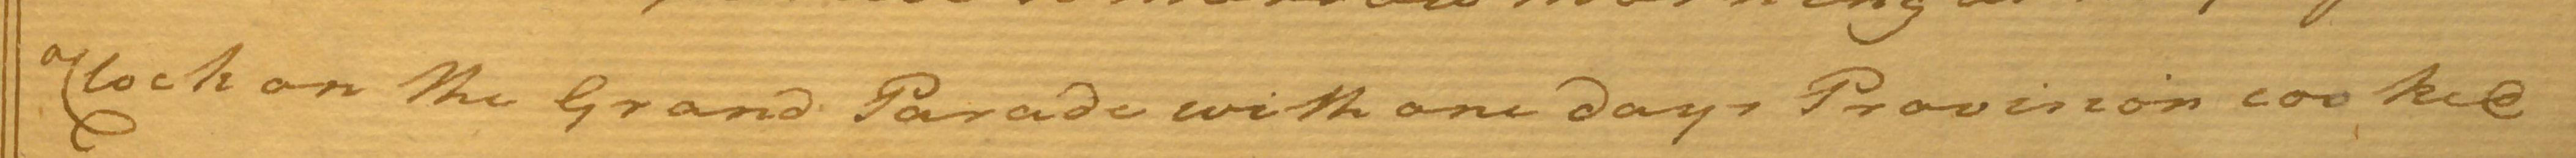^oClock on the Grand Parade with one days Provisions cooked
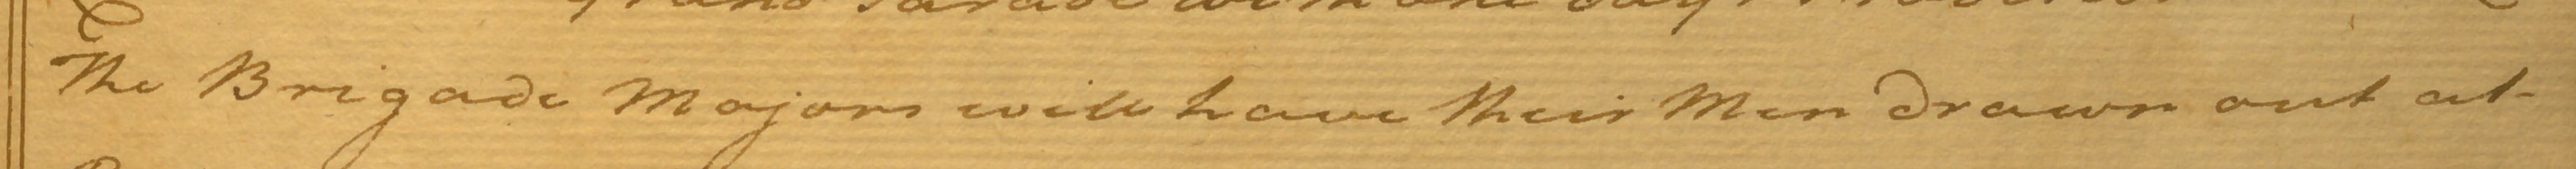The Brigade Majors will have their Men drawn out at
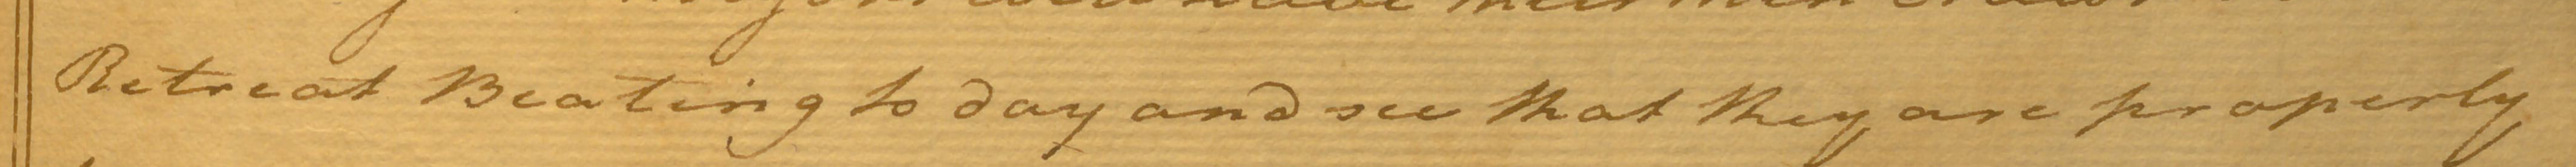Retreat Beating to day and see that they are properly
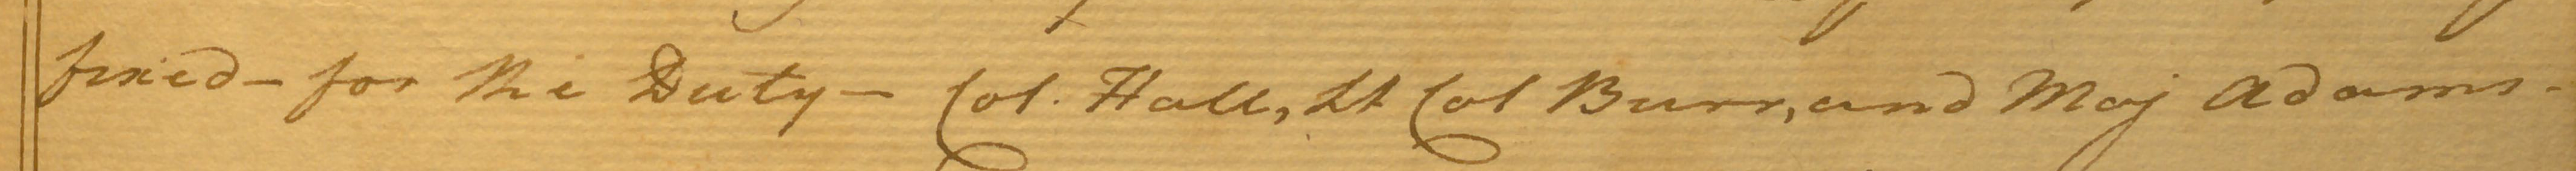fixed- for the Duty- Col. Hall, Lt Col Burr, and Maj Adams
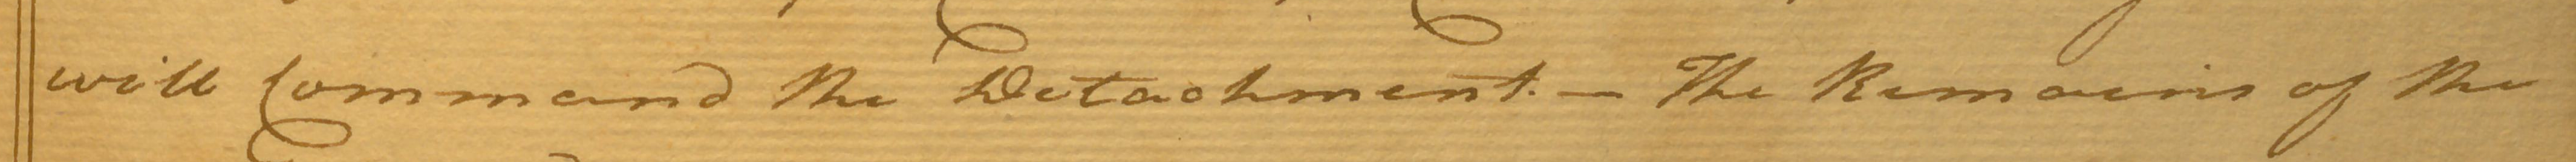will Command the Detachment- The Remains of the
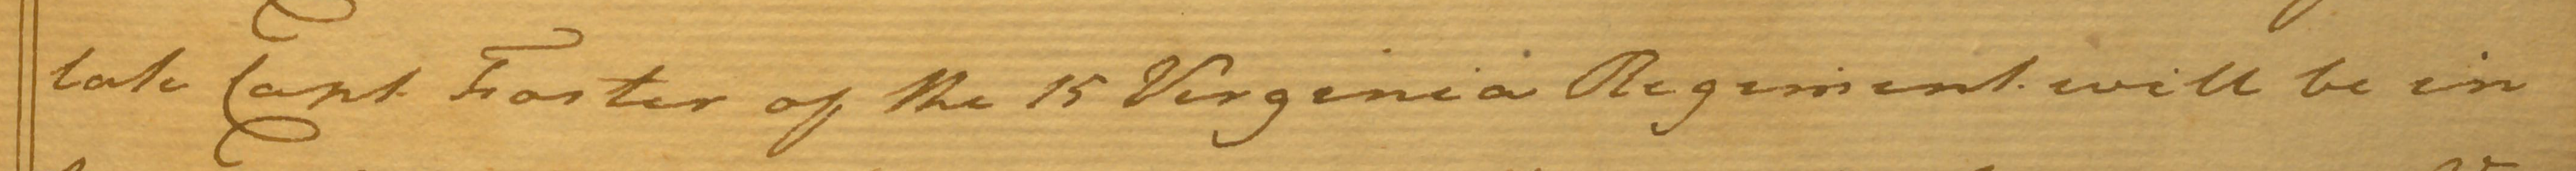late Capt. Foster of the 15 Virginia Regiment will be in
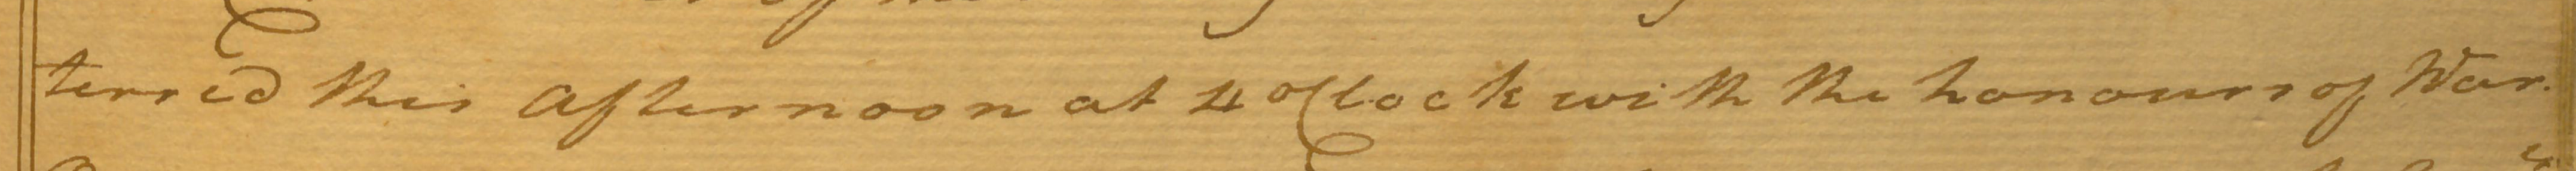terred this Afternoon at 4 ^oClock with the honours of War.
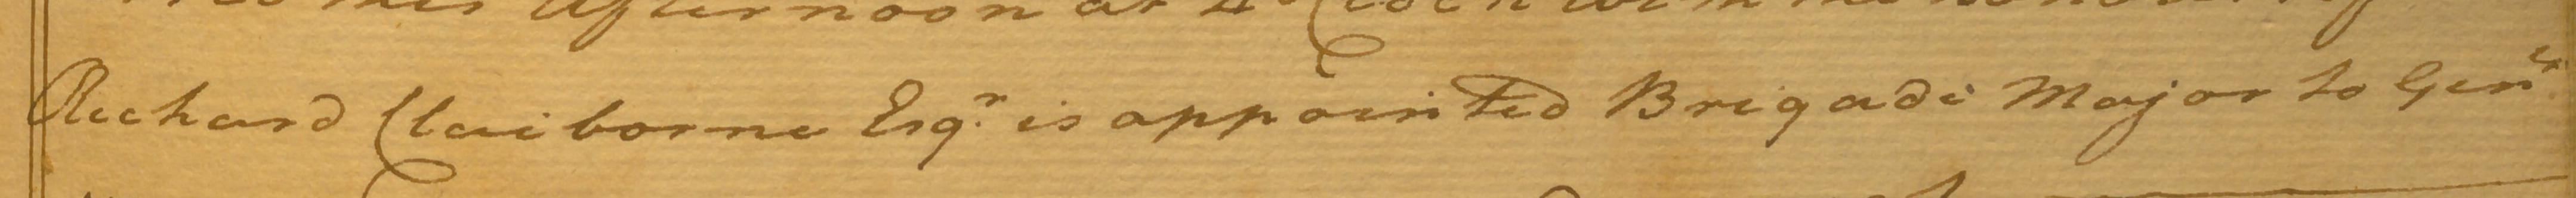Richard Claiborne Esq^r. is appointed Brigade Major to Gen^l
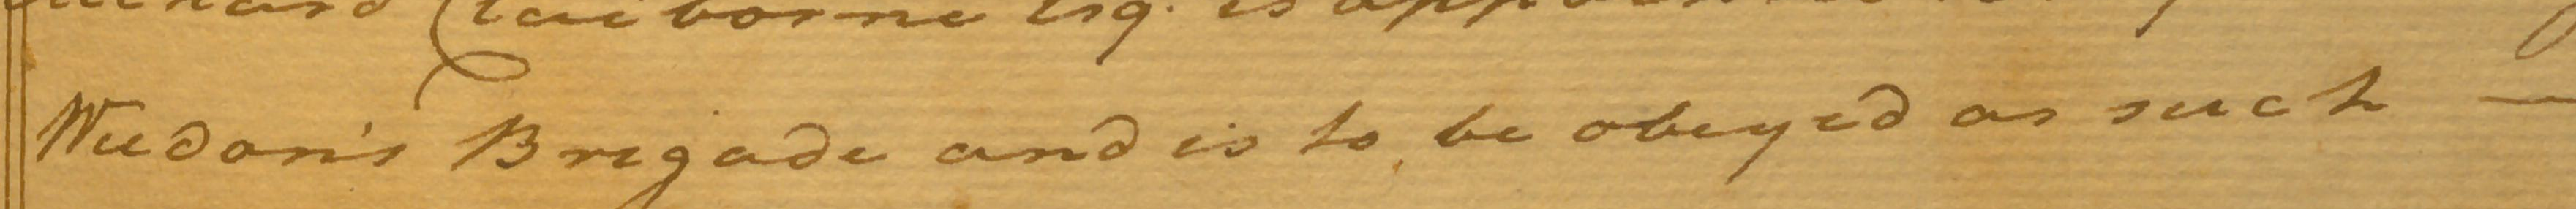Weedon's Brigade and is to be obeyed as such-
